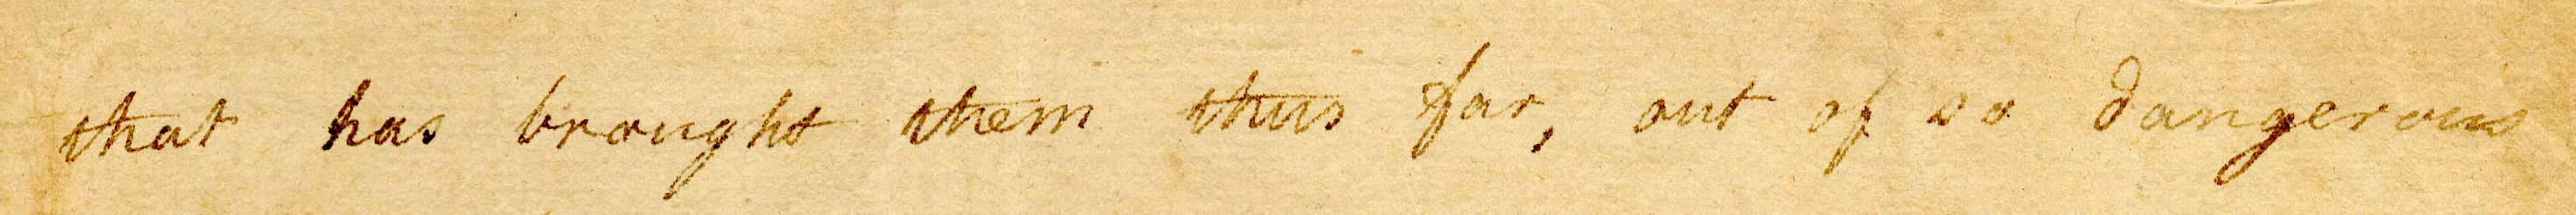that has brought them thus far, out of so dangerous
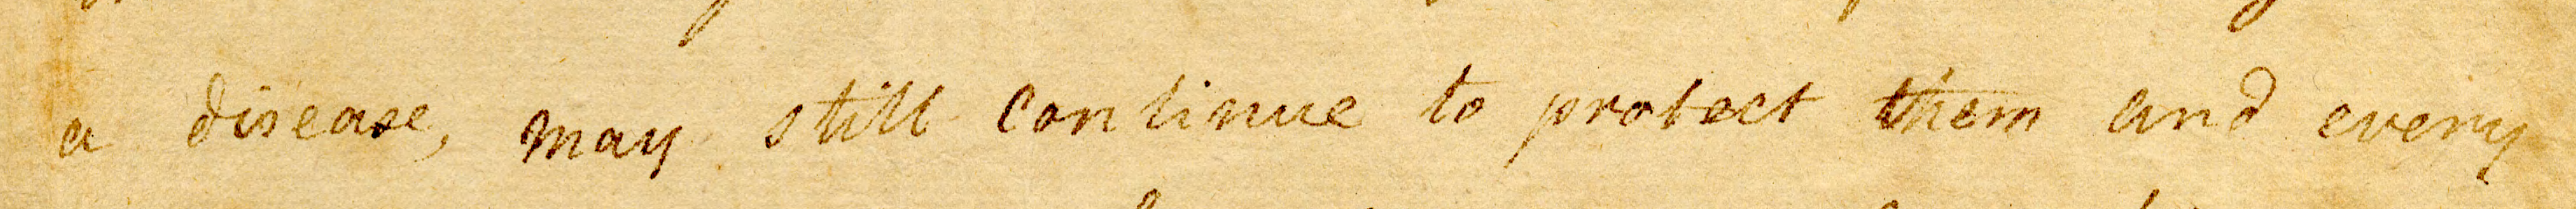a disease, may still continue to protect them and every
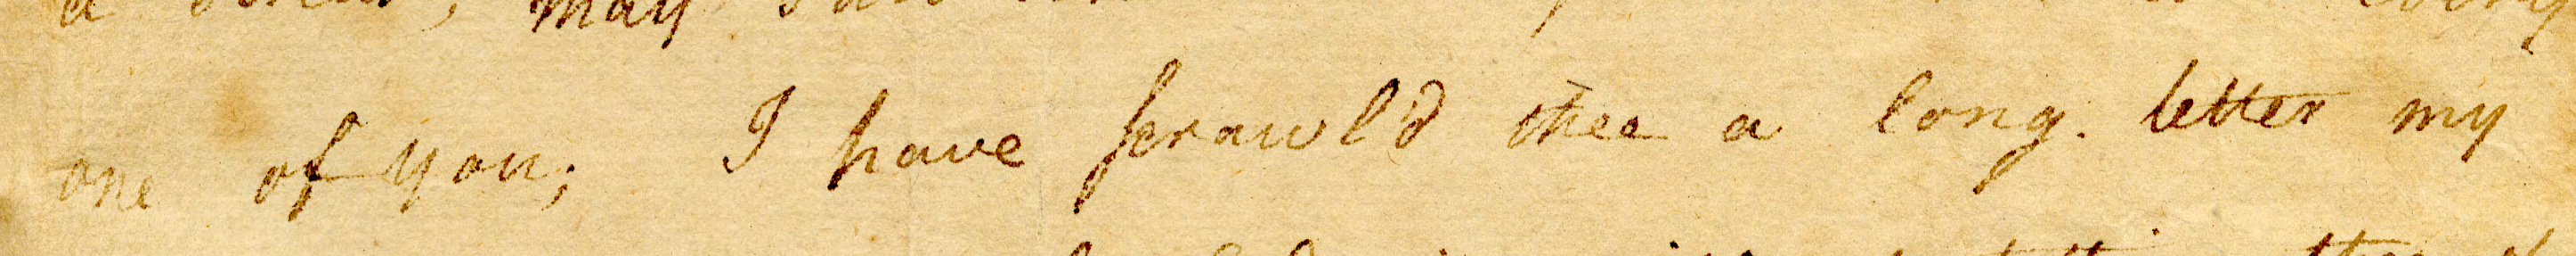one of you; I have scrawl'd thee a long letter my
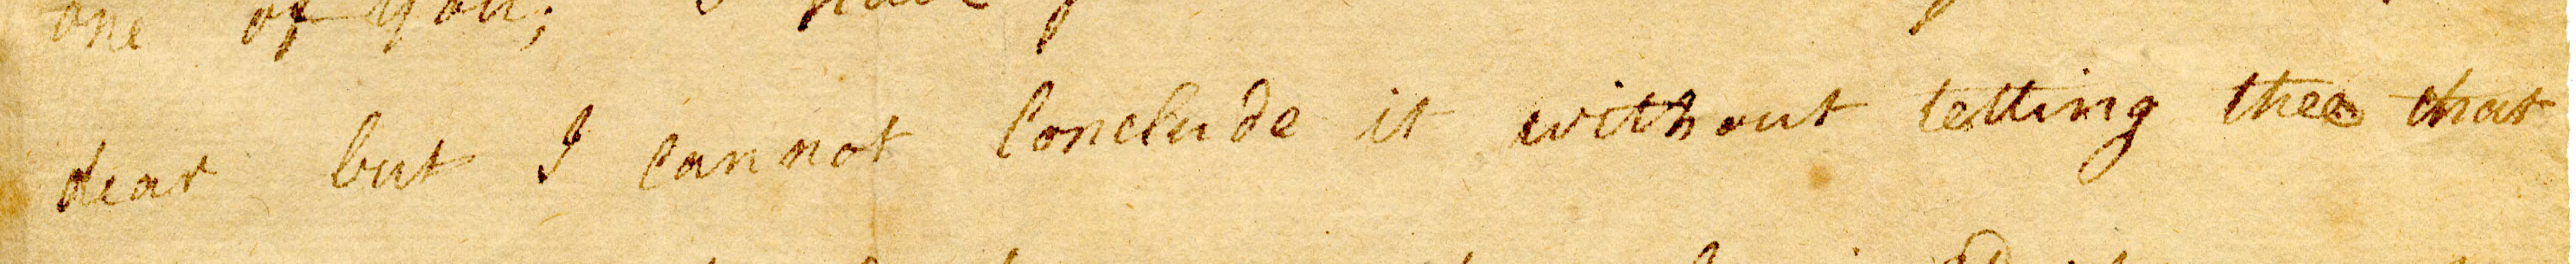dear but I cannot conclude it without telling thee that
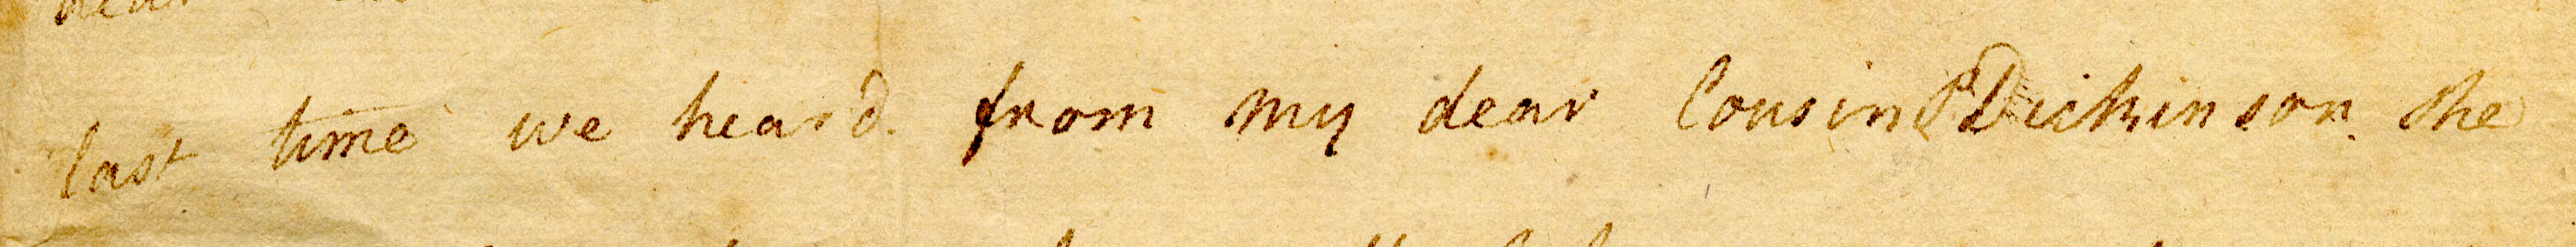last time we heard from my dear Cousin P. Dickinson she
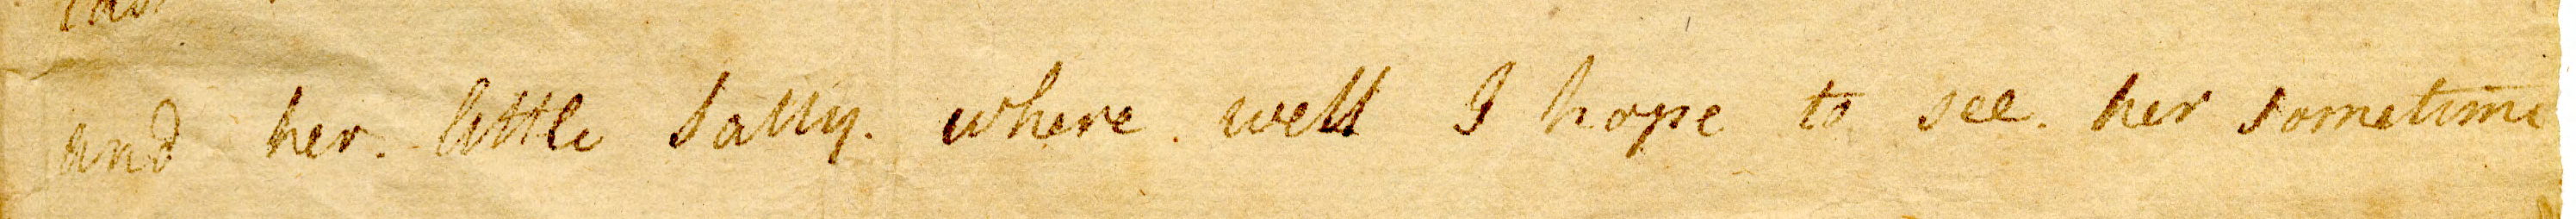and her little Sally where well I hope to see her sometime
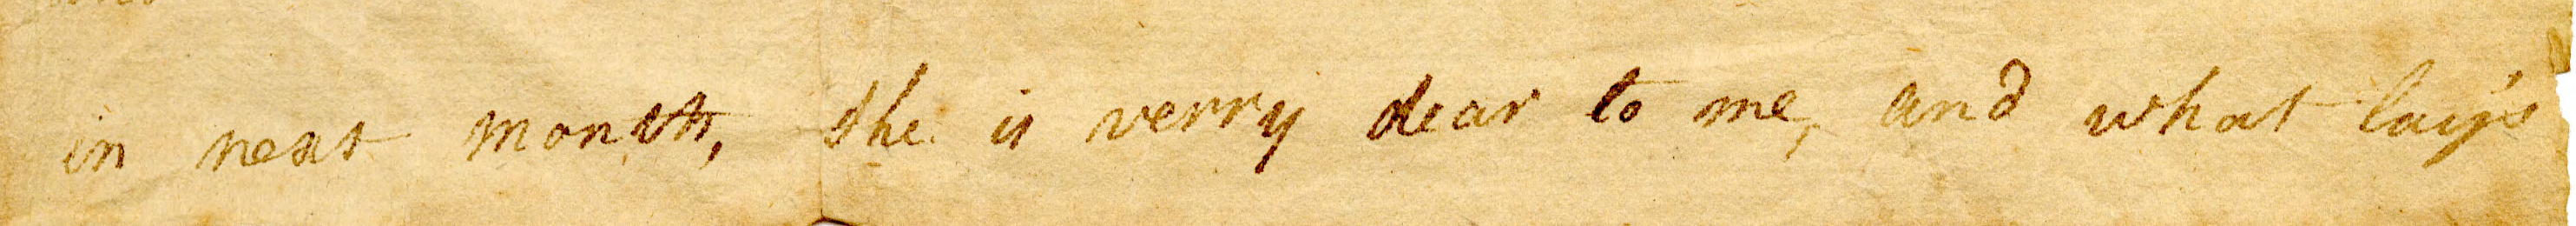in next month, she is verry dear to me and what lay's
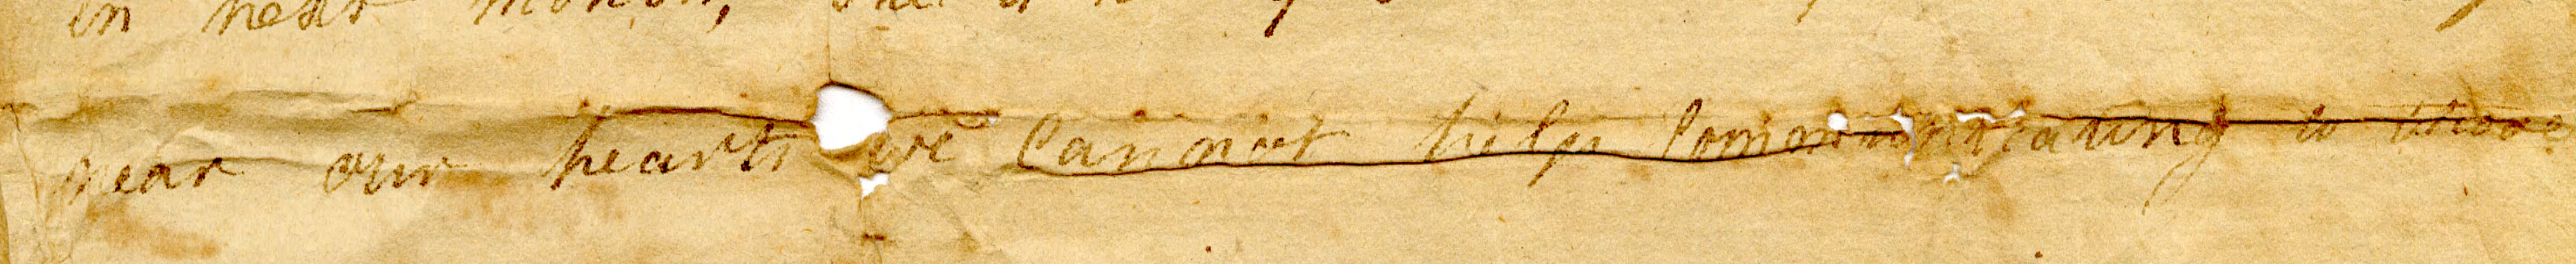nears our hearts we cannot help communicating to those
